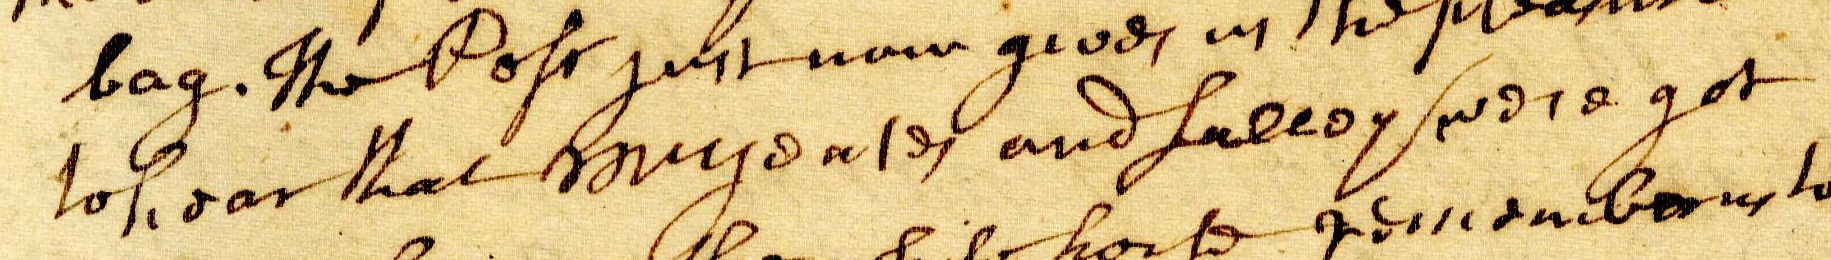to hear that Mr Yeates and Sulley were got
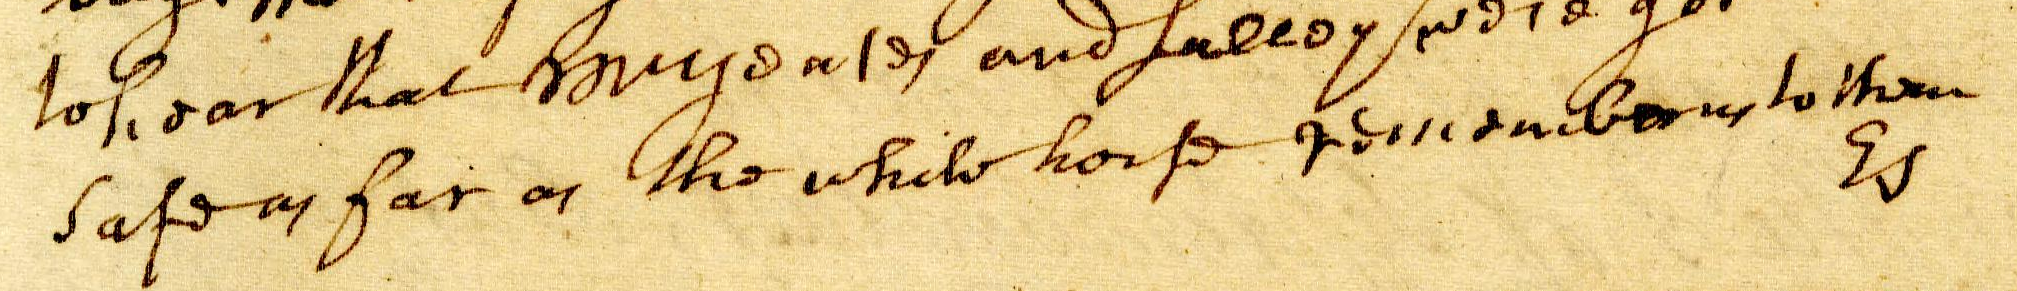Safe as far as the white horse remember me to then
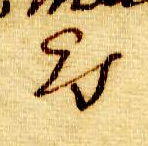ES
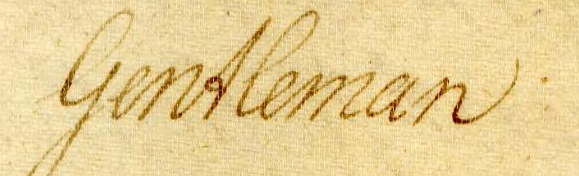Gentleman
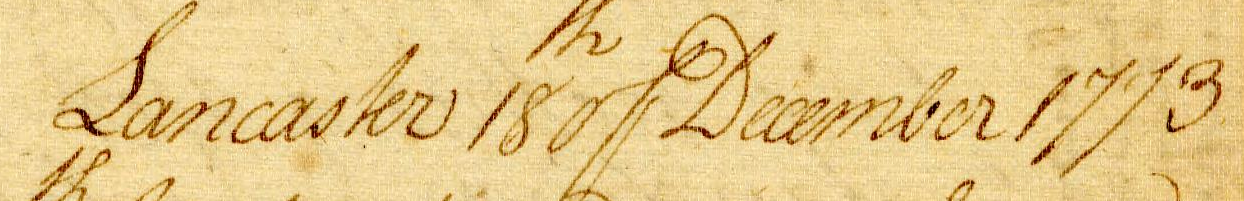Lancaster 18^th of December 1773
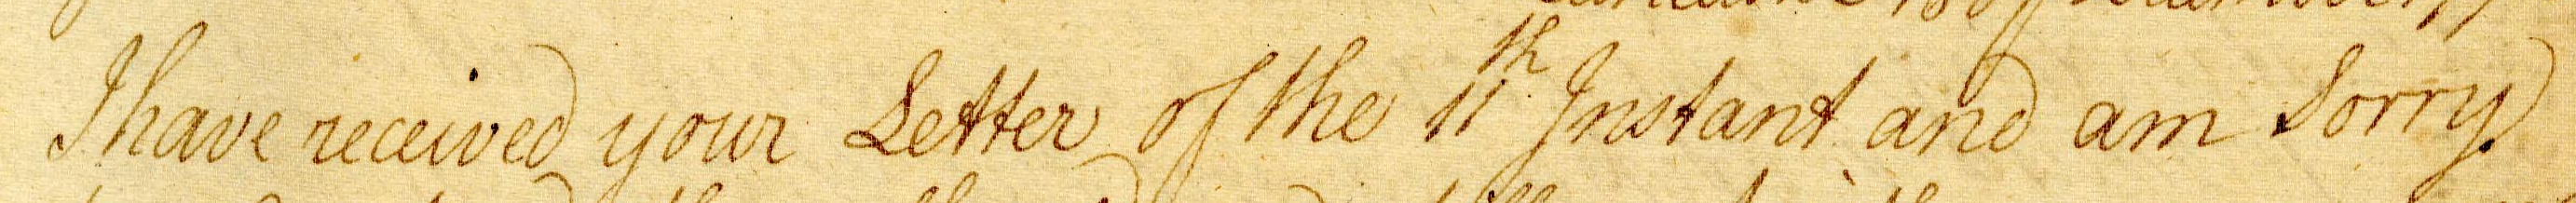I have received your Letter of the 11^th Instant and am Sorry
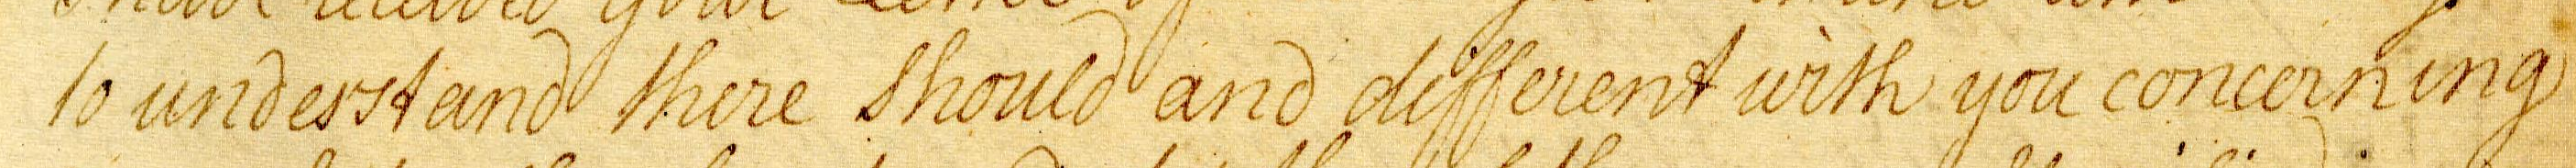to understand there should and different with you concerning
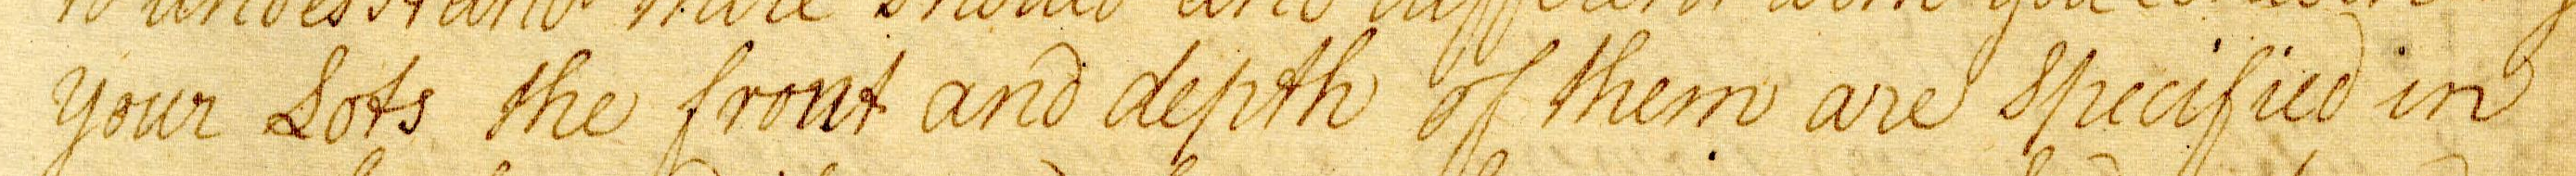your Lots the front and depth of them are specified in
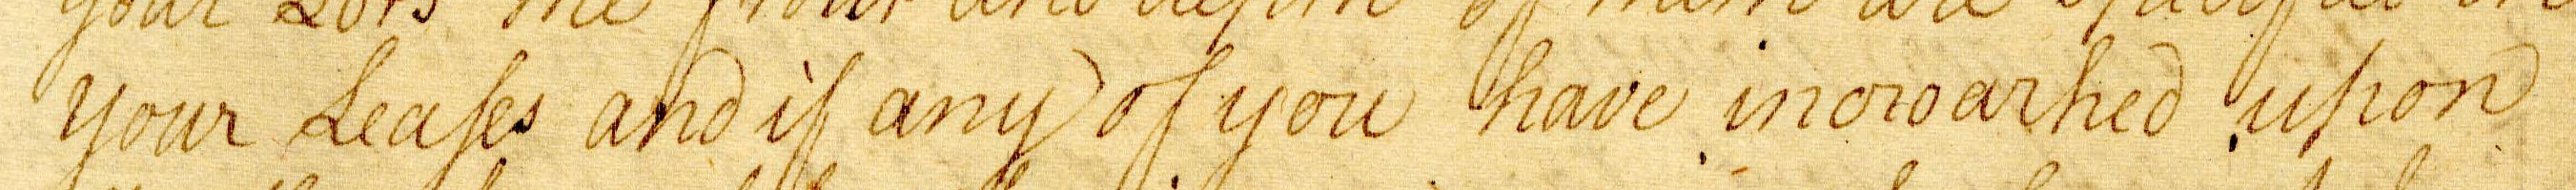your Leases and if any of you have incroached upon
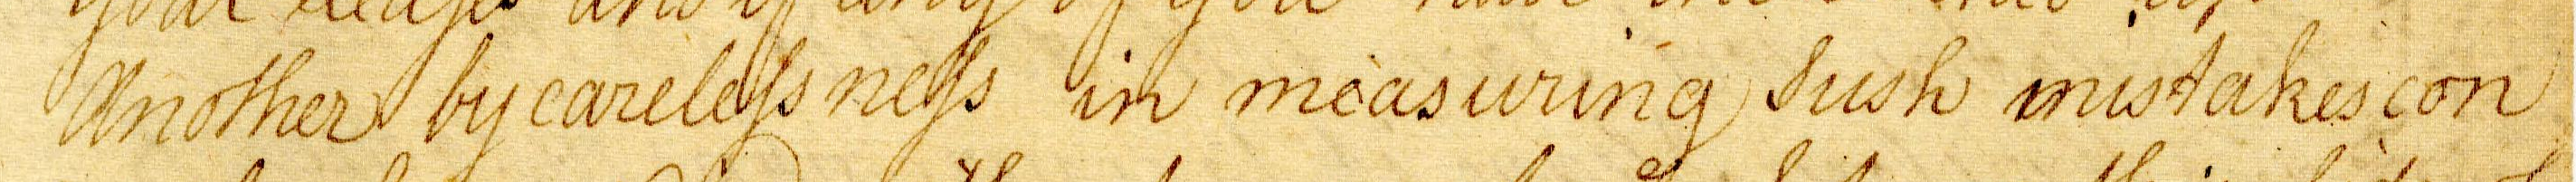Another by carelessnesss in measuring, sush mistakes con
